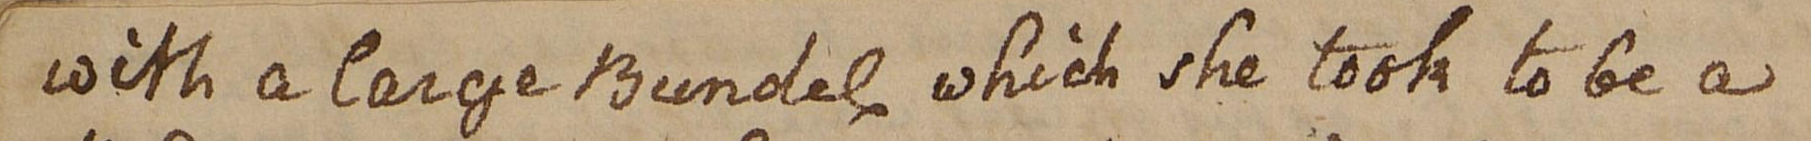with a large Bundel which she took to be a
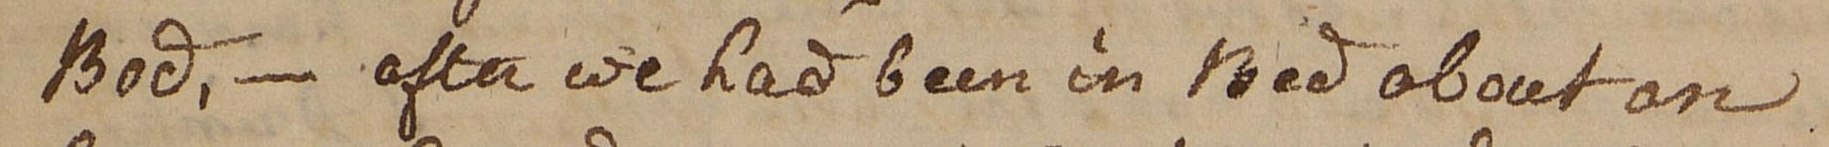Bed,- after we had been in Bed about an
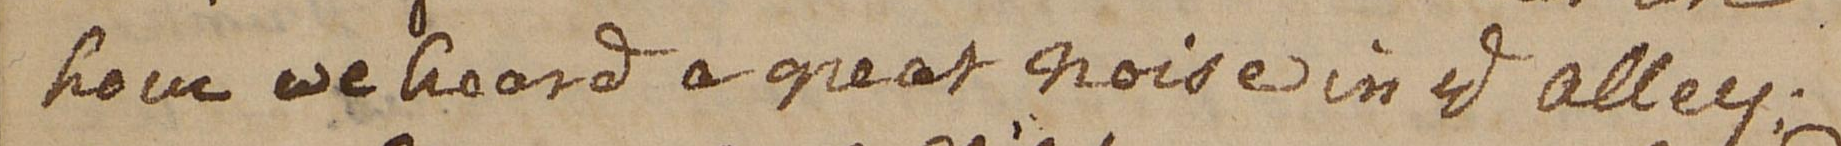hour we heard a great noise in y^e alley;
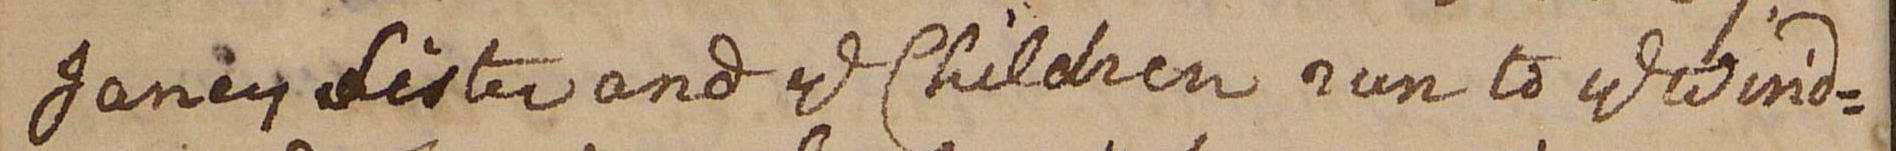Janey Sister and y^e Children run to y^e wind-
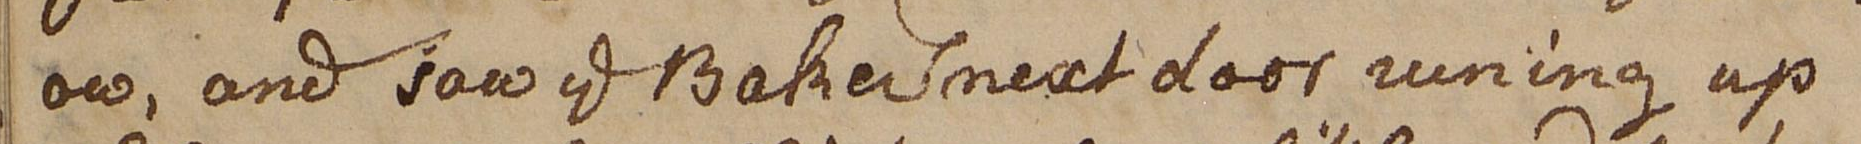ow, and saw y^e Baker next door runing up
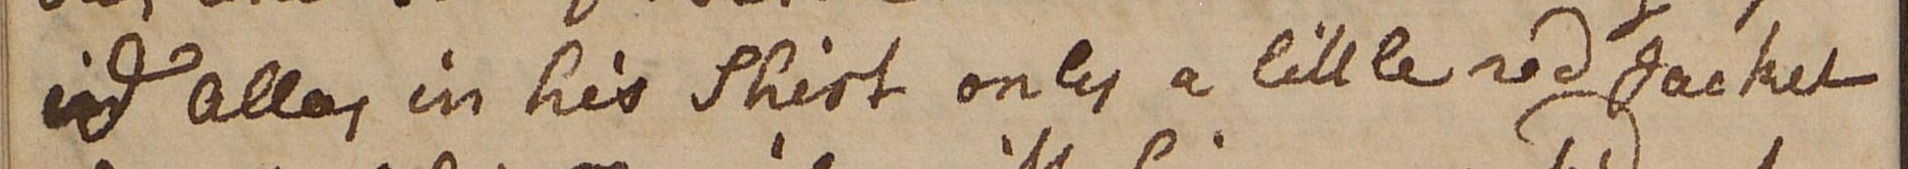y^e ally in his Shirt only a little red Jacket
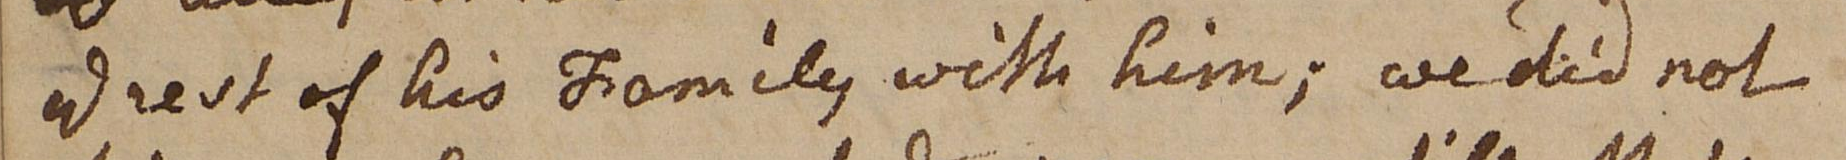y^e rest of his Family with him; we did not
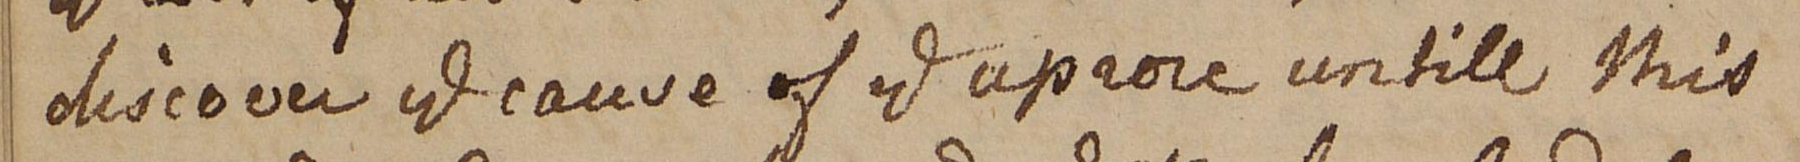discover y^e cause of y^e uprore untill this
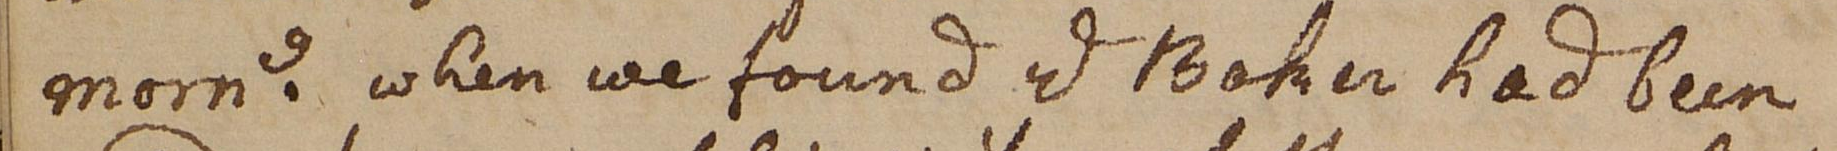morn^g. when we found y^e Baker had been
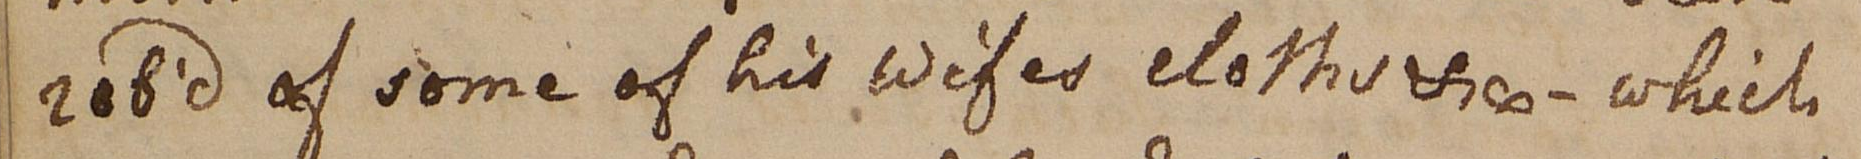rob'd of some of his Wifes cloths &c- which
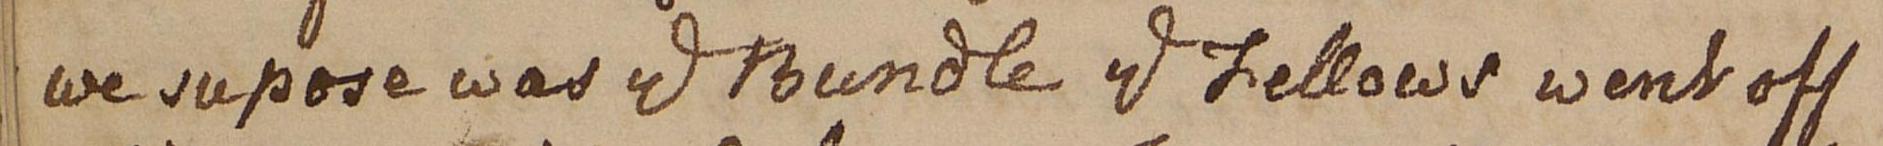we supose was y^e Bundle y^e Fellows went off
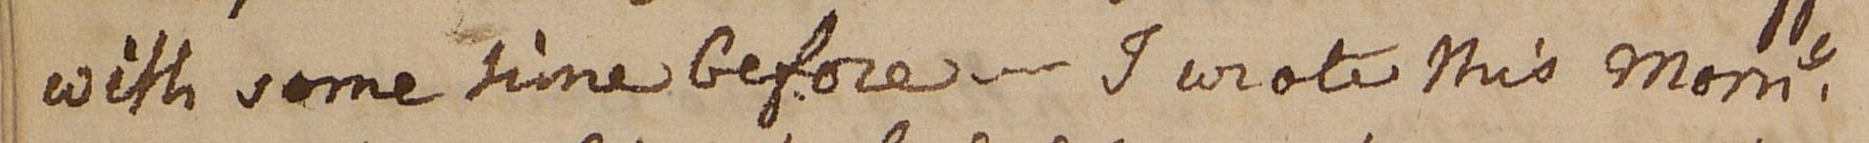with some time before- I wrote this Morn^g.
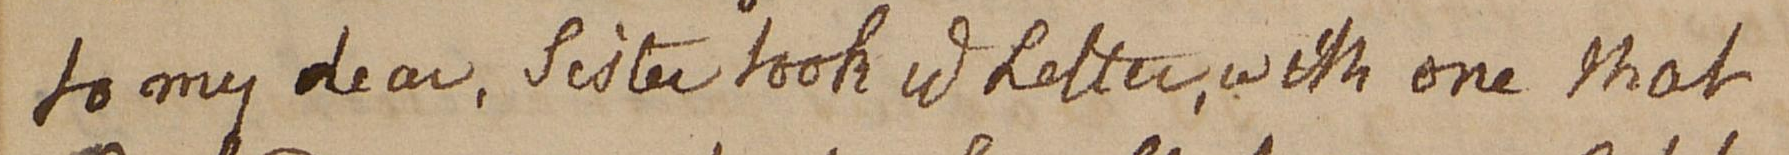to my dear, Sister took y^e Letter, with one that
